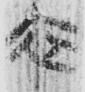衣
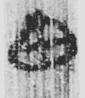甶（思→使）
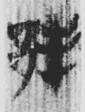邦
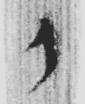人
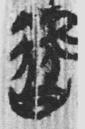{虍皆}（皆）
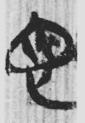見
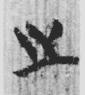之
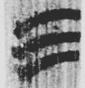三
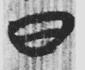日
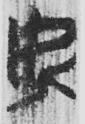○（焉）
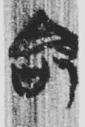命（令）
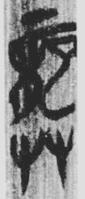龏（龔）
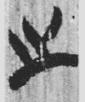之
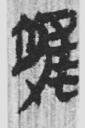○（脽）
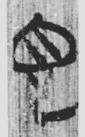見
